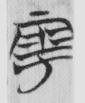𩁹
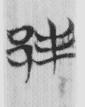邦
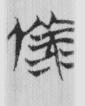備
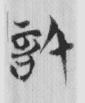信
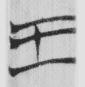王
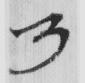乃
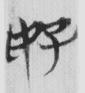好
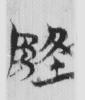陞
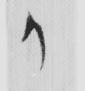人
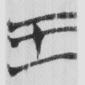王
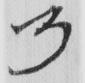乃
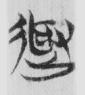{辶取}
